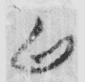㠯（以）
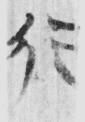行
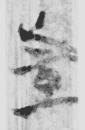㞷
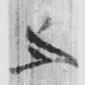之
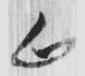㠯（以）
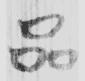{厶厶厶}
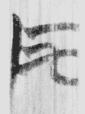厇
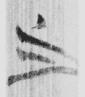之
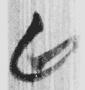㠯（以）
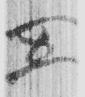五
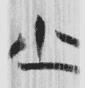少
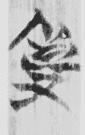事
